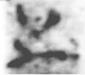韌
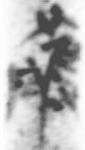雘
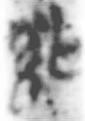紳（靷）
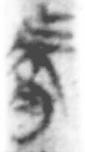○（虎）
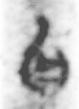首
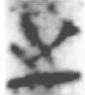之
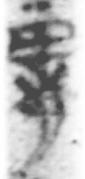○（蒙）
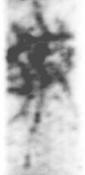鞁（轡）
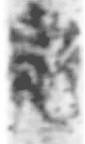轡
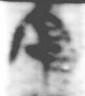○（中）
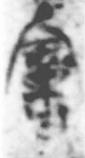○（守）
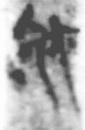○（令）
